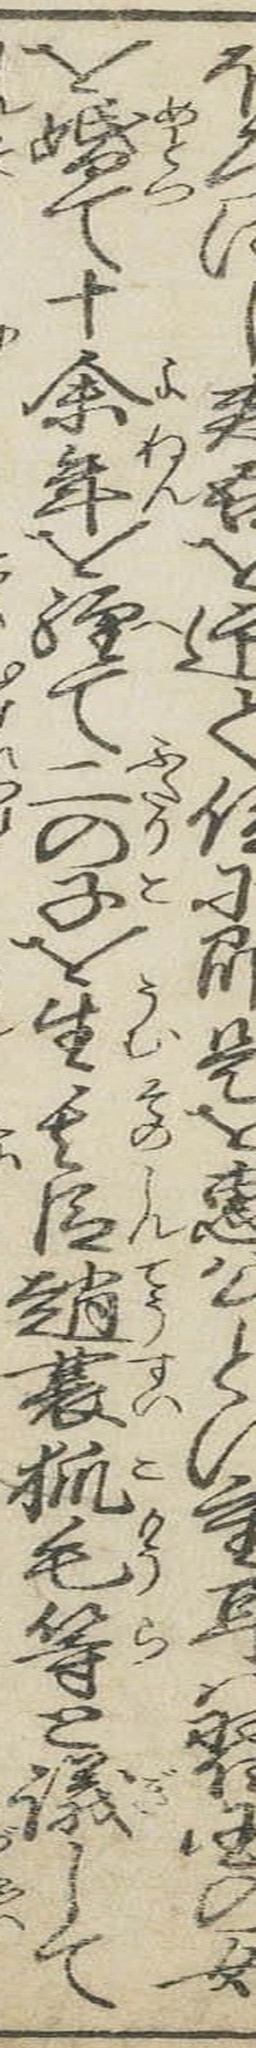を婚て十余年を経て二の子を生其臣趙衰孤毛等と議して
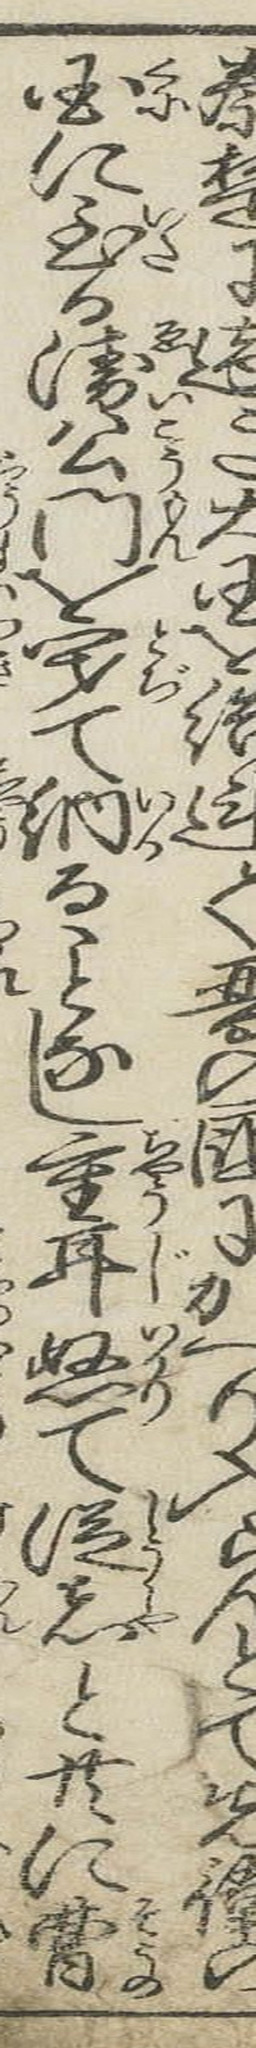国に至る衛公門を閉て納ることなし重耳怒て従者と共に曹
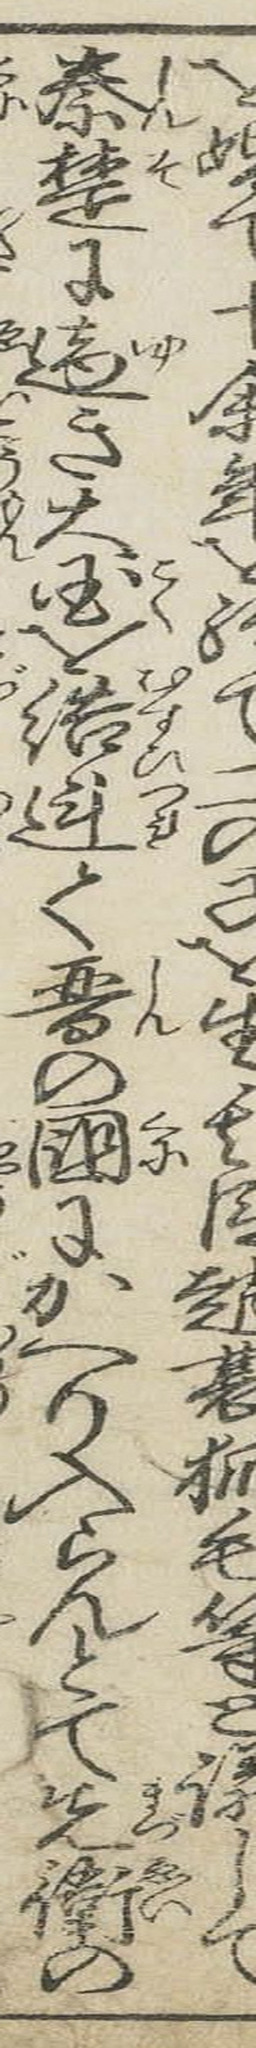秦楚に適き大国を結連て晋の国にかへり入らんとて先衛の
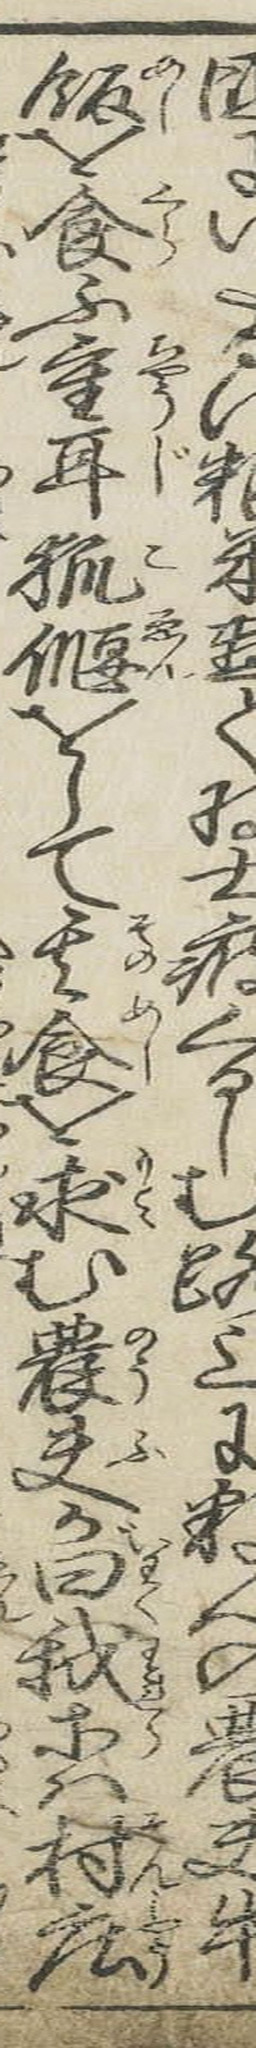飯を食ふ重耳孤偃をして其食を求む農夫が曰我等は村庄
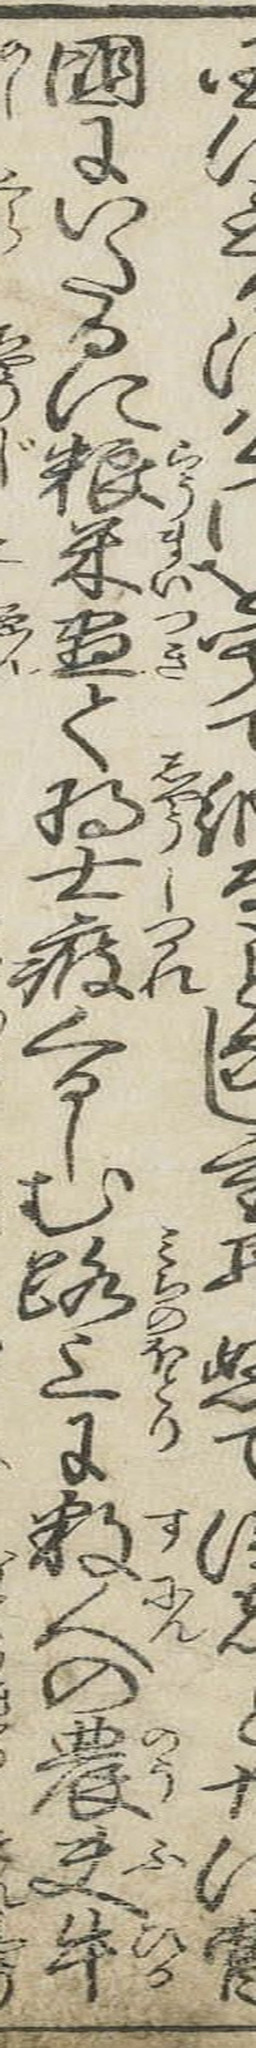国にいたるに粮米尽て将士疲くるしむ路上に数人の農夫午
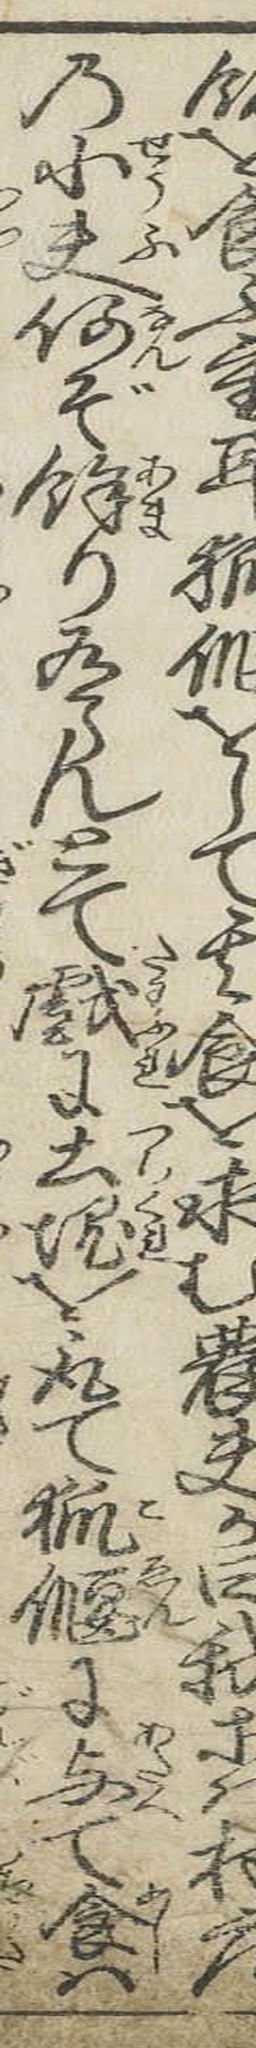の小夫何ぞ余り有らんとて戯に土塊を取て孤偃に与て食は
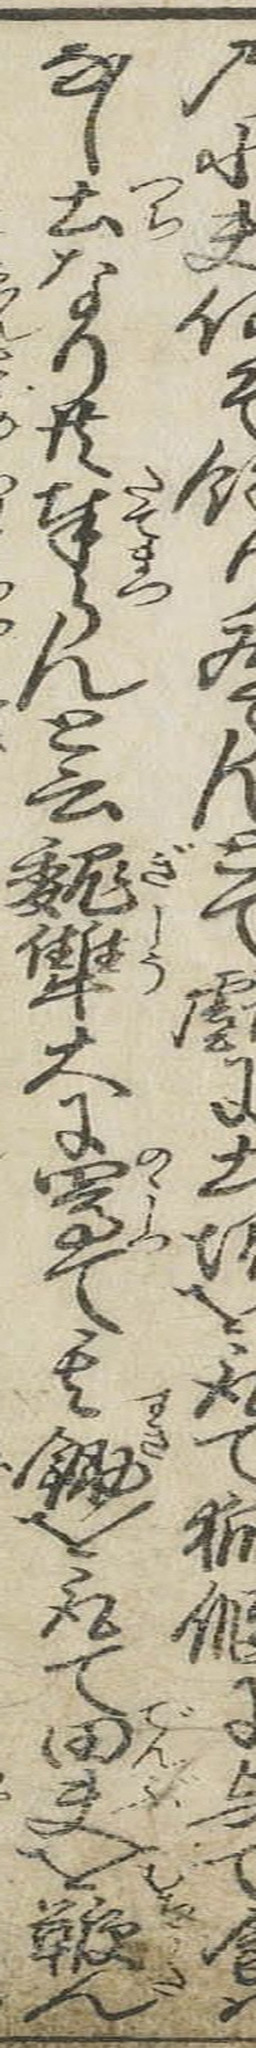なし土なり共奉らんと云魏犨大に罵て其鋤を取て田夫を鞭ん
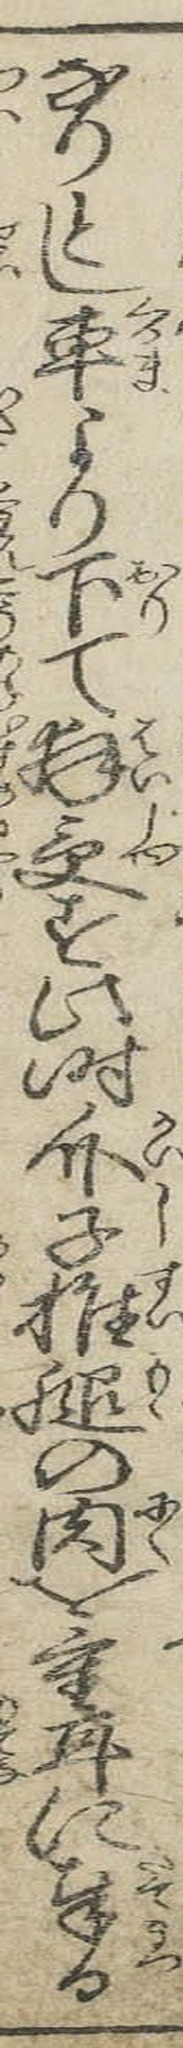なりとし車より下て拝受す此時介子推腿の肉を重耳に奉る
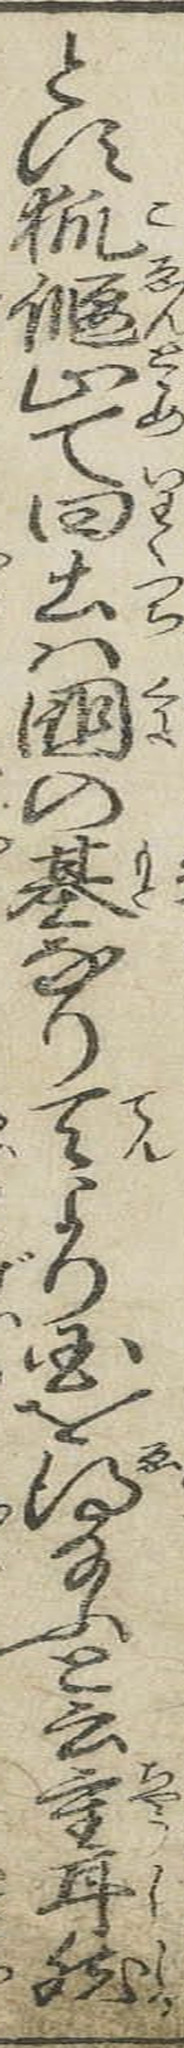とす孤偃止て曰土は国の基なり天より国を得給ふと云重耳然
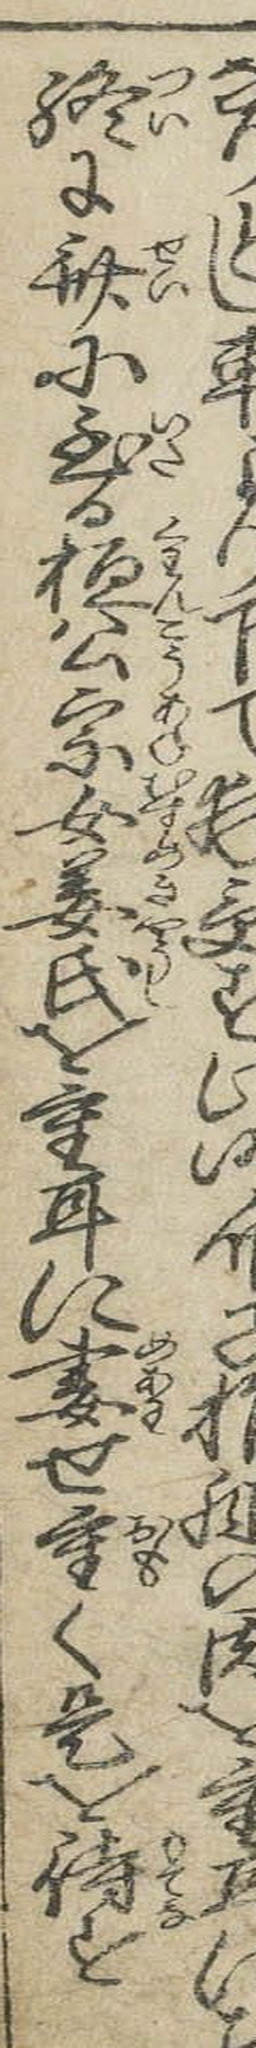終に斉に至る桓公宗女姜氏を重耳に妻せ重く是を待す

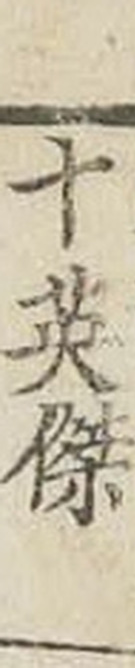十英傑
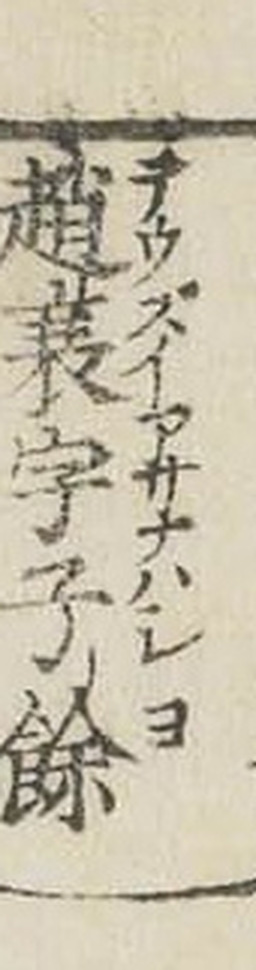趙衰字子-余
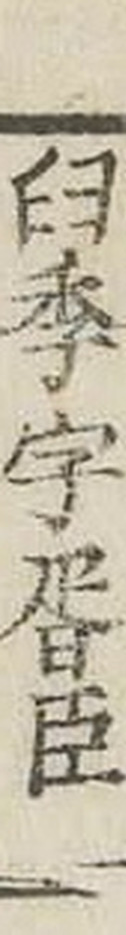臼季字胥臣
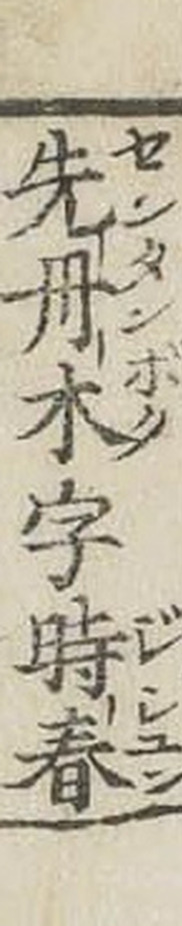先-丹-木字時-春

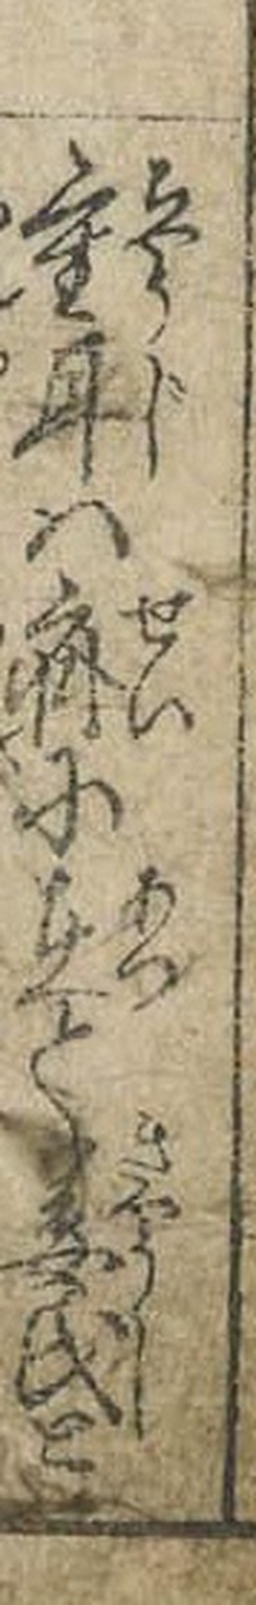重耳は斉に在て姜氏と
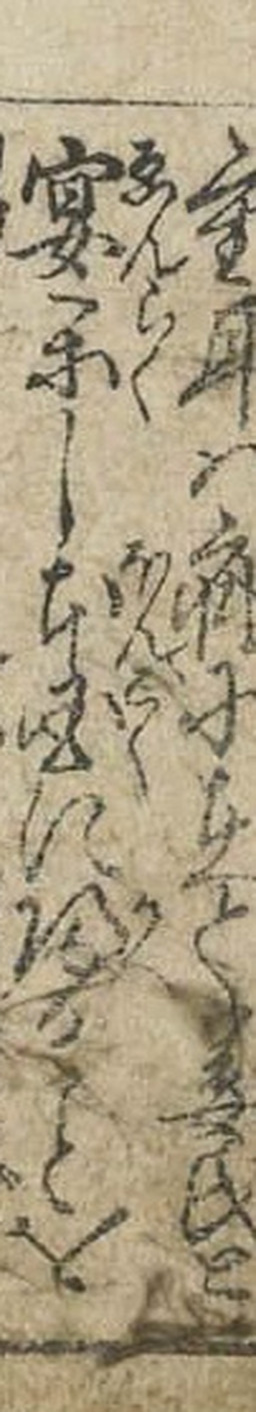宴楽し本国に帰ることを
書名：絵本写宝袋 9巻 5之巻
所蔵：東京学芸大学教育コンテンツアーカイブ
